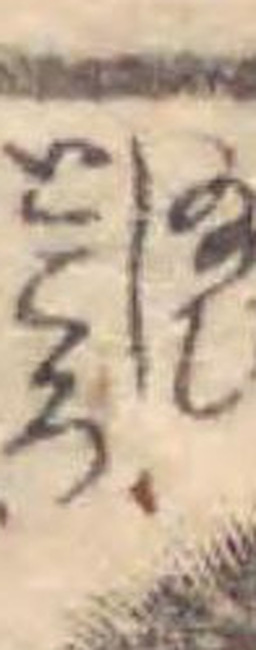ところ
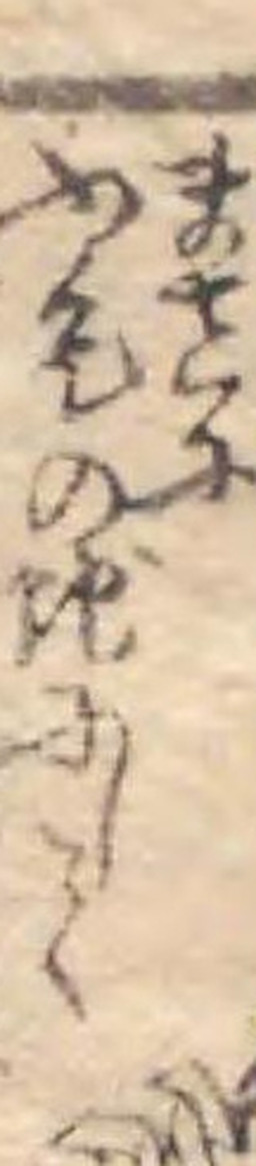不毛の地にして
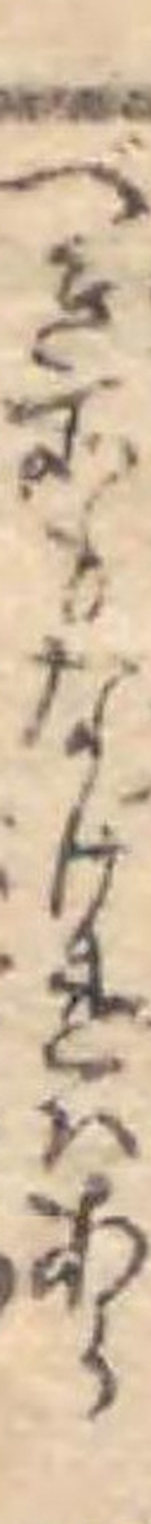べき所もなけれはあら
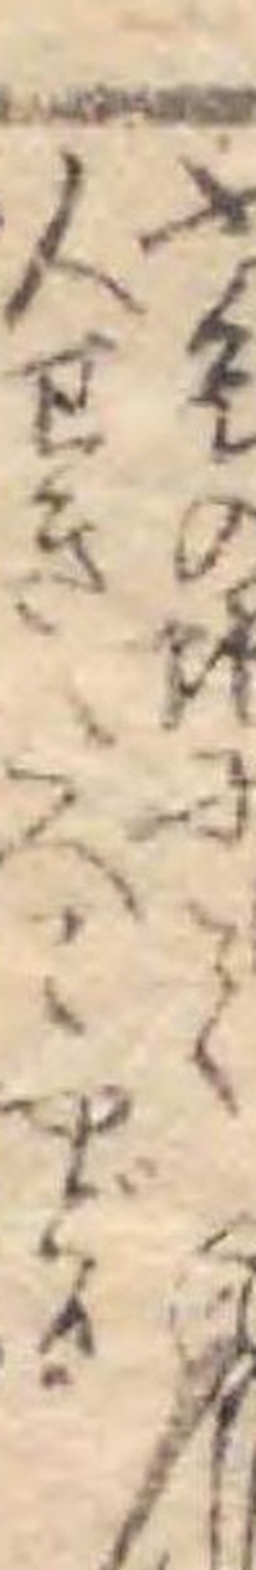人せきたへてやどる
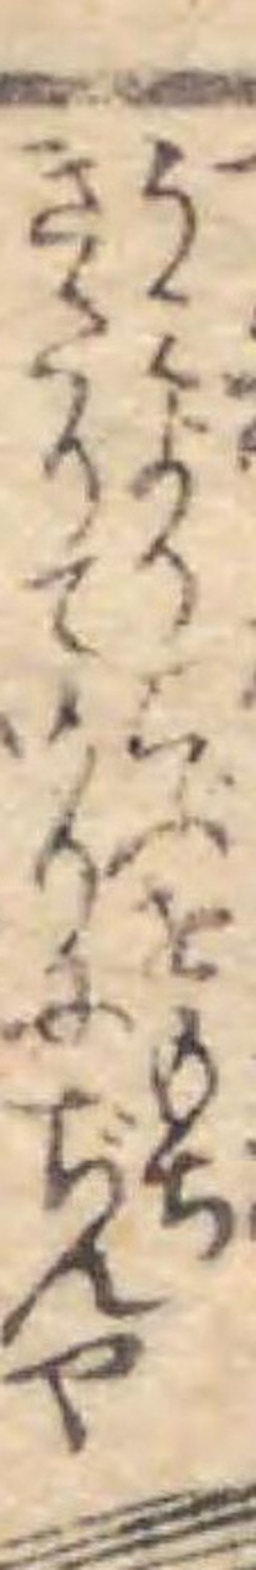きたりてかりにぢんや
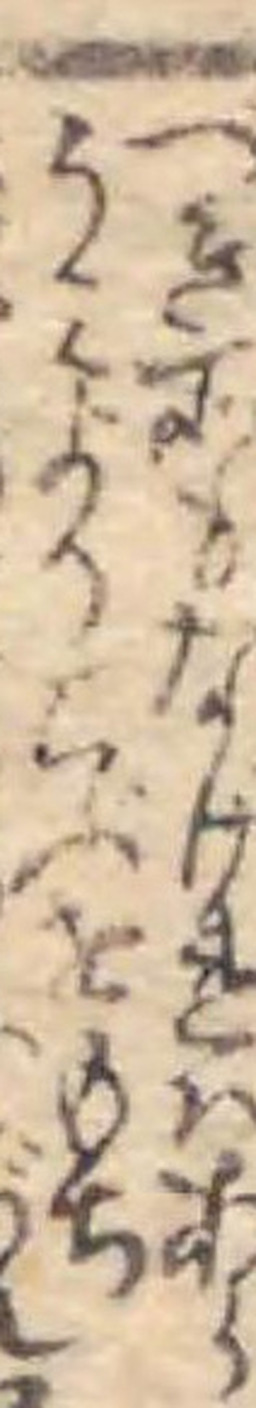うみよりこぶをもち
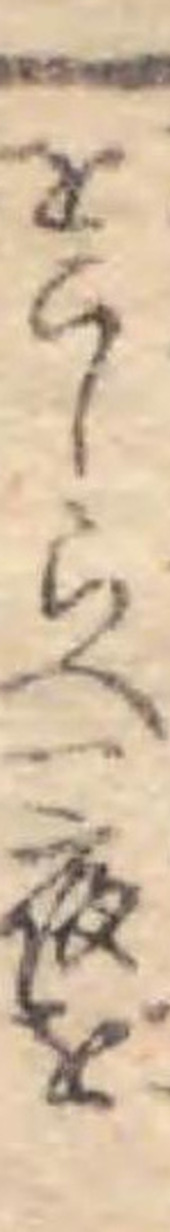をこしらへ一夜を
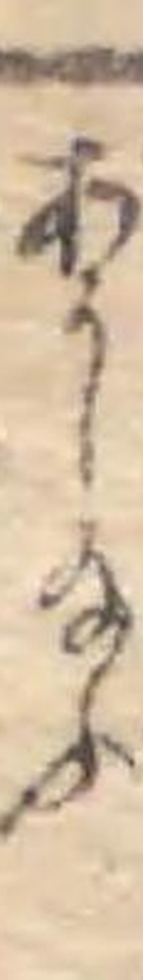あかし給ふ
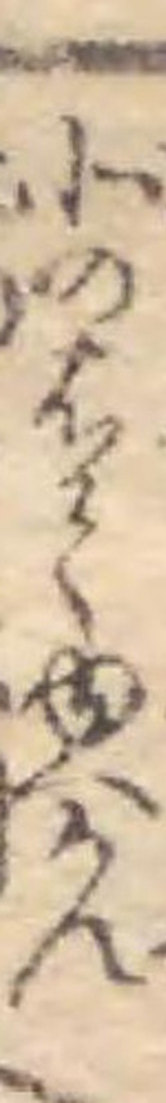北のはてゆへかん
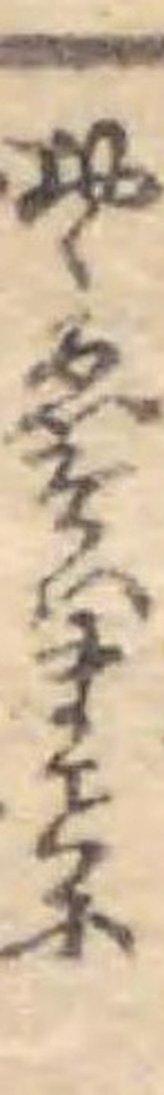おくゑそはまことに
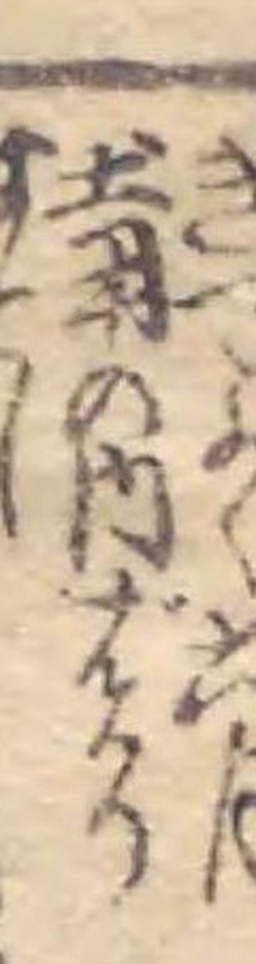土用の内ばかり
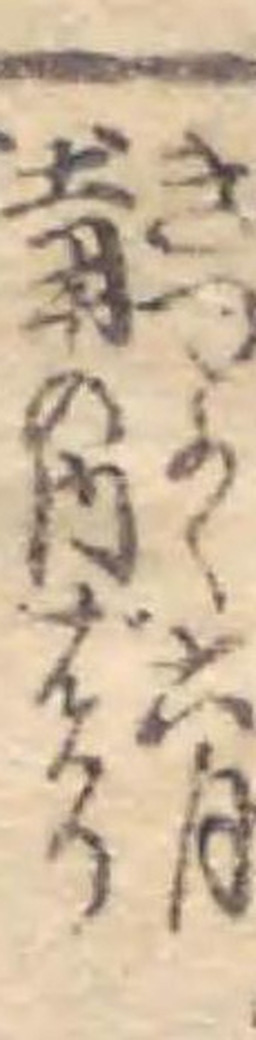土用の内ばかり
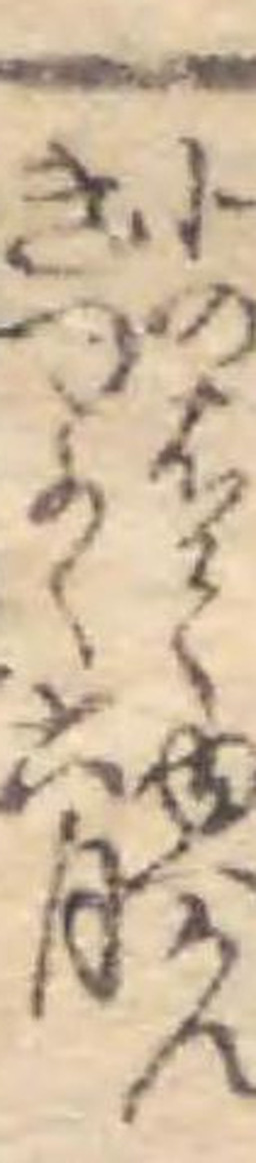きつよく六月
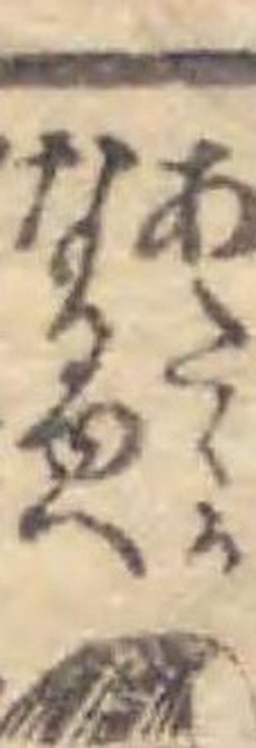なるゆへ
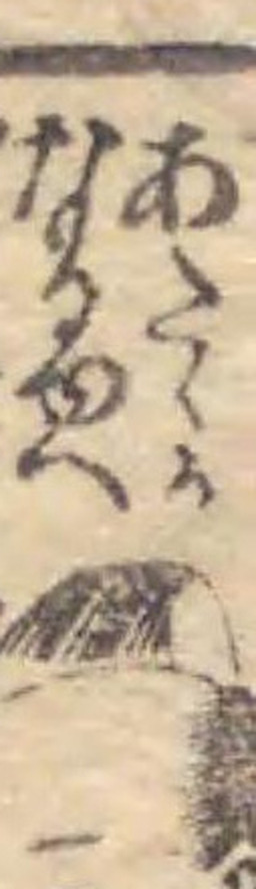なるゆへ
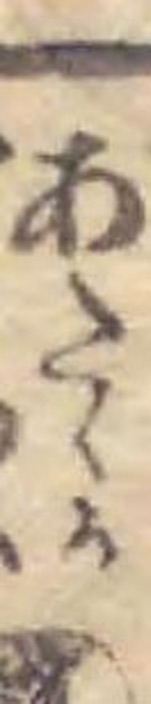あたゝか
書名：悦贔負蝦夷押領 : 3巻
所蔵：国立国会図書館 National Diet Library, JAPAN
